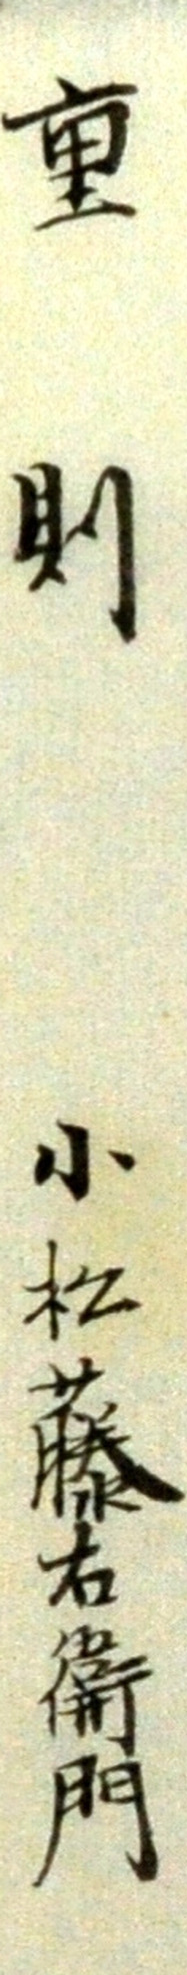重則小松藤右衛門
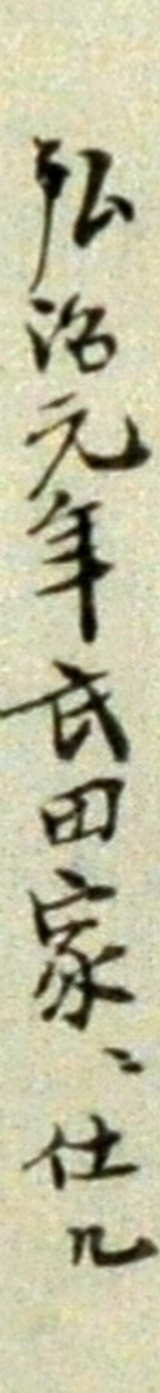弘治元年武田家ニ仕ル

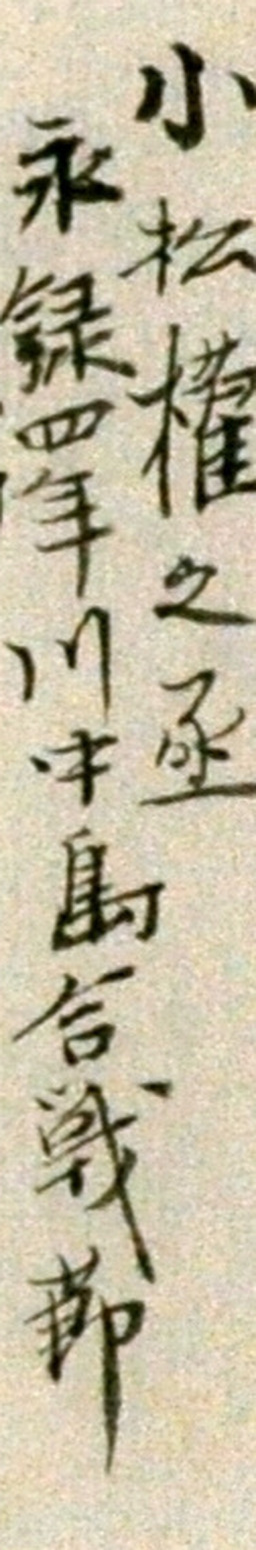永録四年川中島合戦節
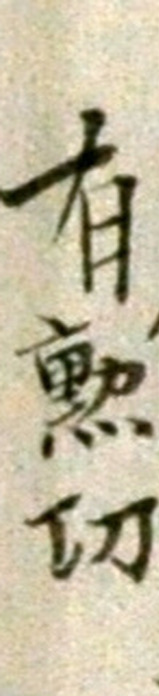有勲功
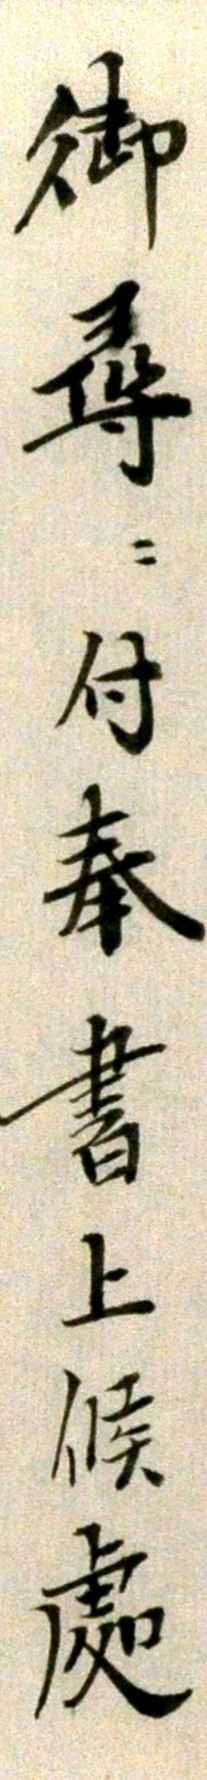御尋ニ付奉書上候処
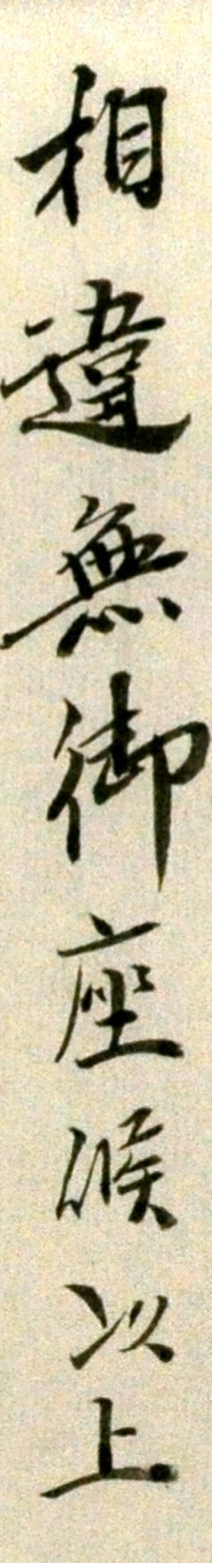相違無御座候以上
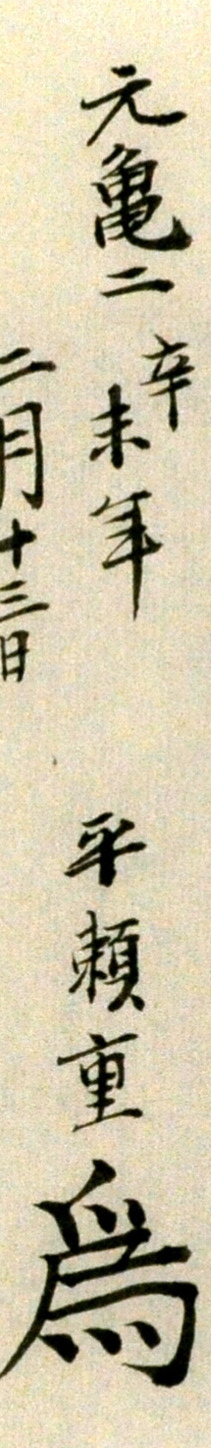元亀二辛未年平頼重為
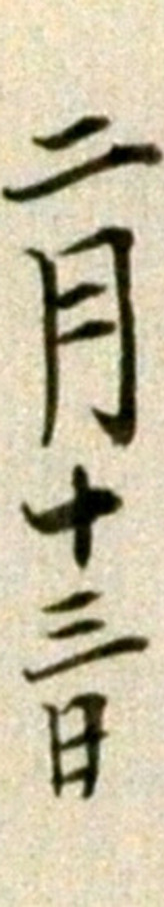二月十三日
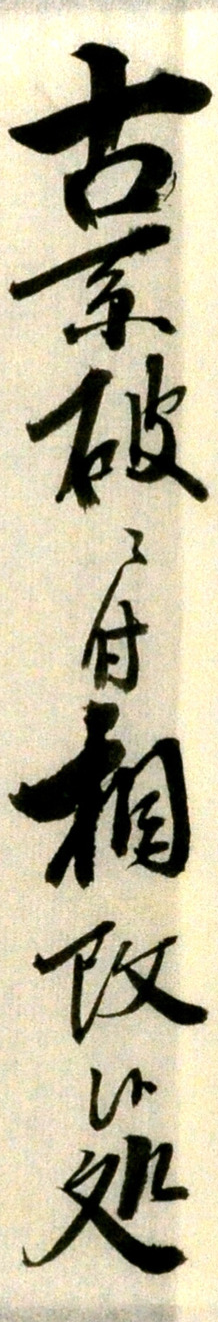古系破ニ付相改候処
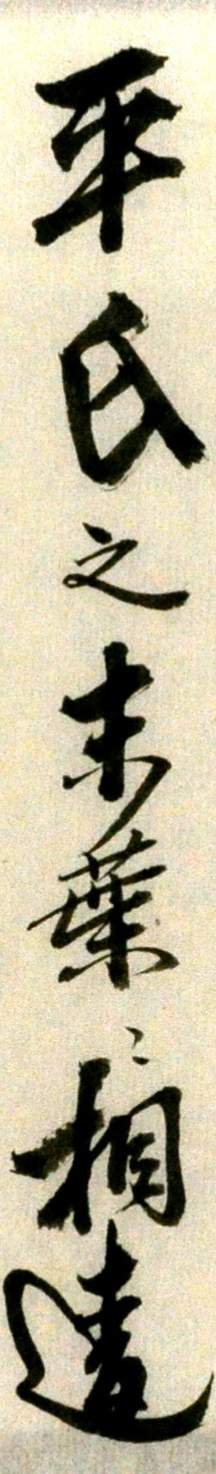平氏之末葉ニ相違
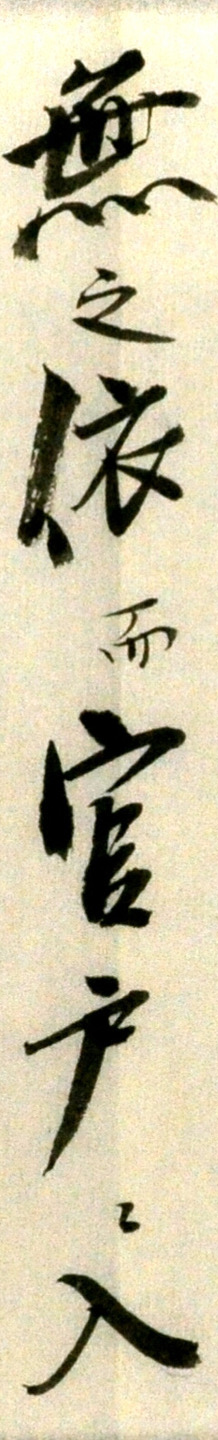無之依而官戸ニ入
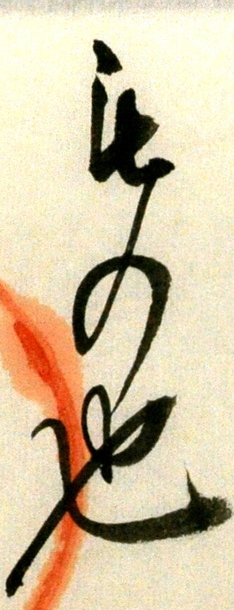もの也
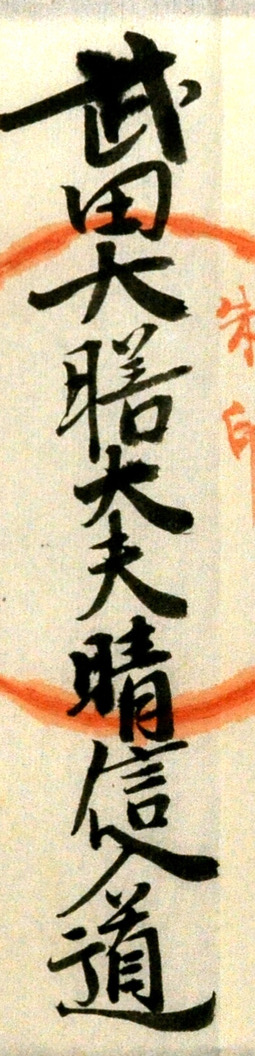武田大膳大夫晴信入道

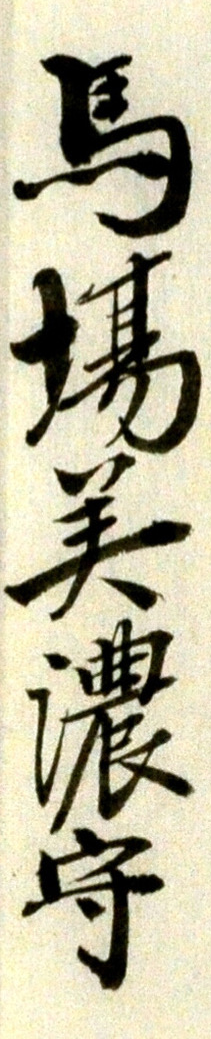馬場美濃守
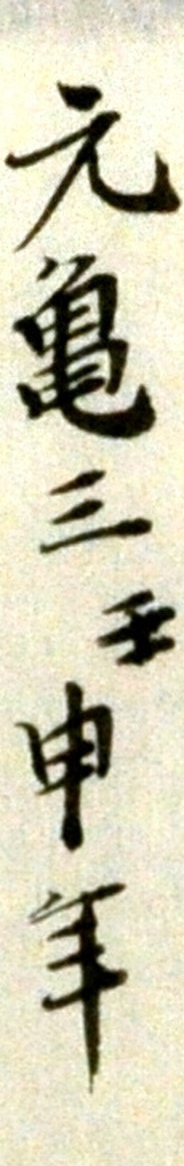元亀三壬申年
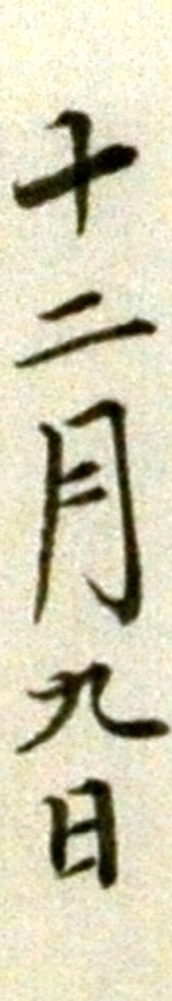十二月九日
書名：小松家古系図写・一通、浦村家筋帳抜粋・一通
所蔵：伊那市立高遠町図書館・合同会社AMANE
